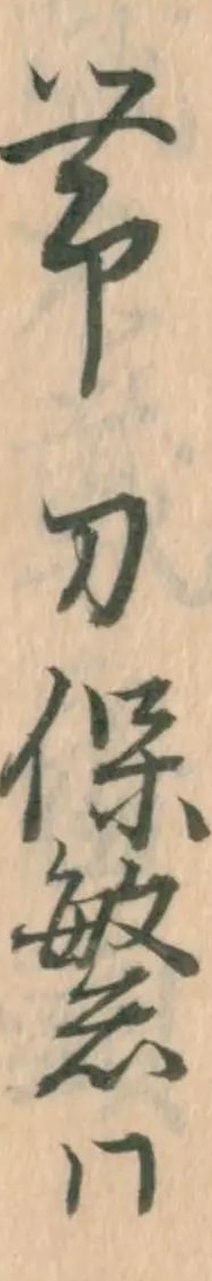帯刀保繁同

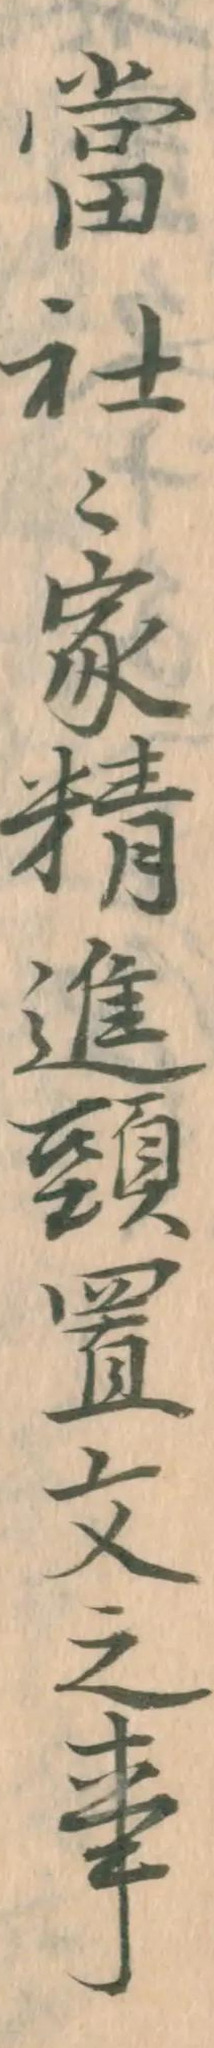當社々家精進頭置文之事
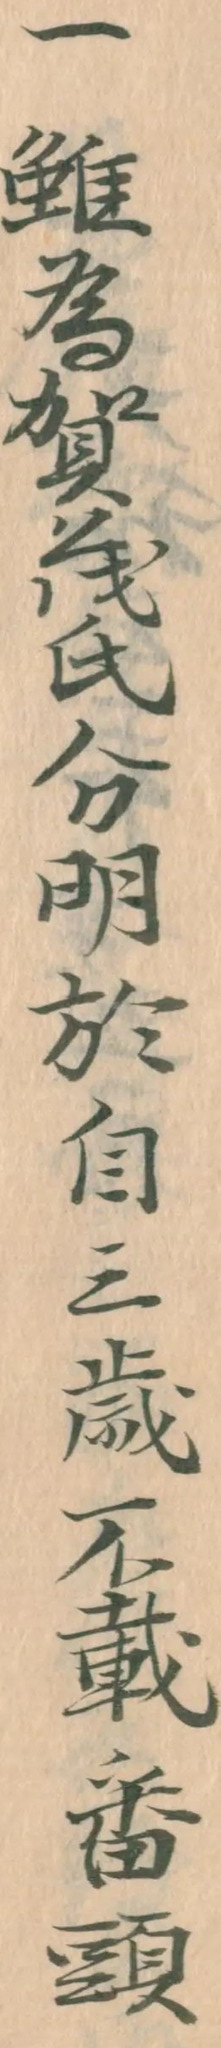一、雖為賀茂氏分明於自三歳不載番頭
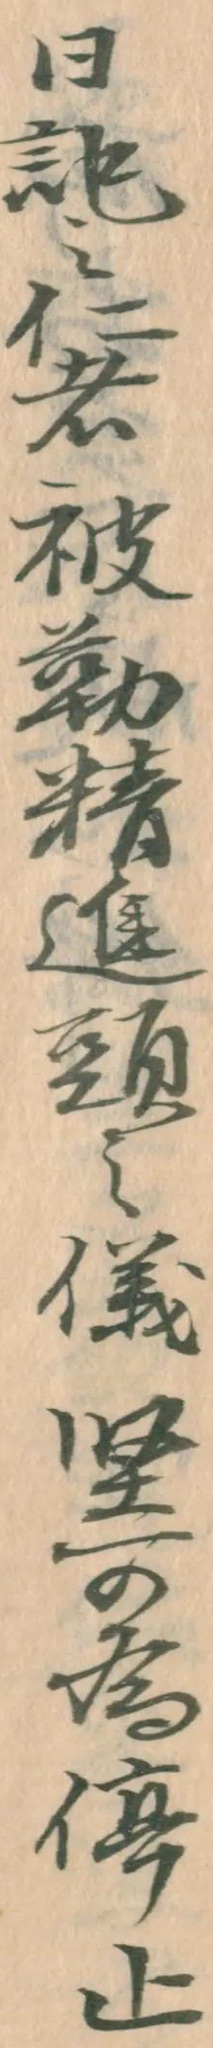日記之仁者被勤精進頭之儀堅可為停止
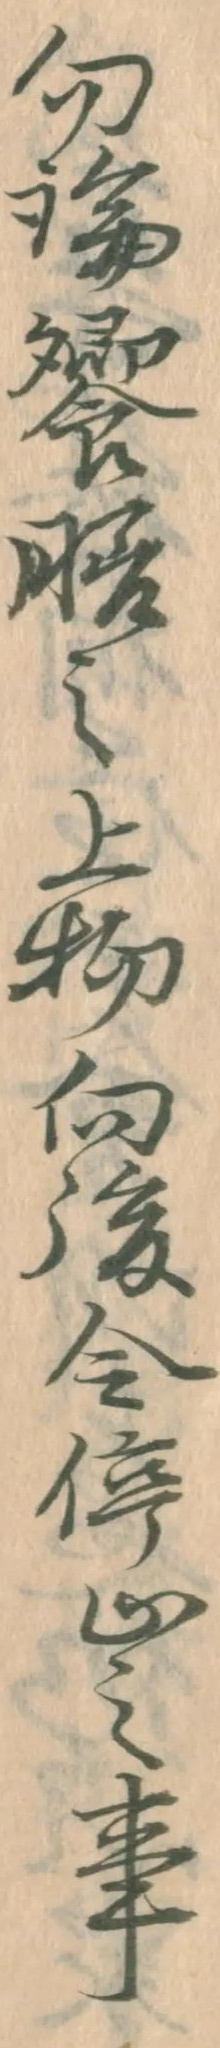勿論饗膳之上物向後令停止之事
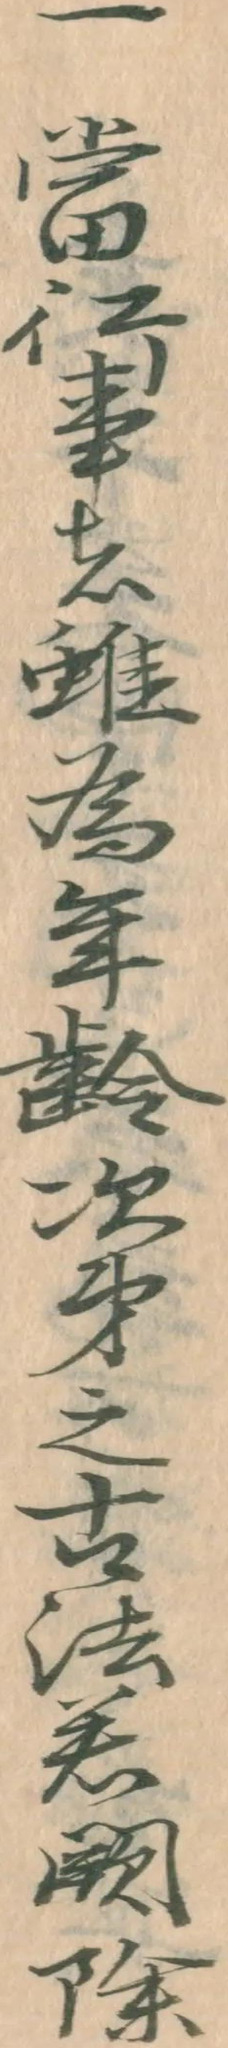一、當行事者雖為年齢次第之古法若闕除
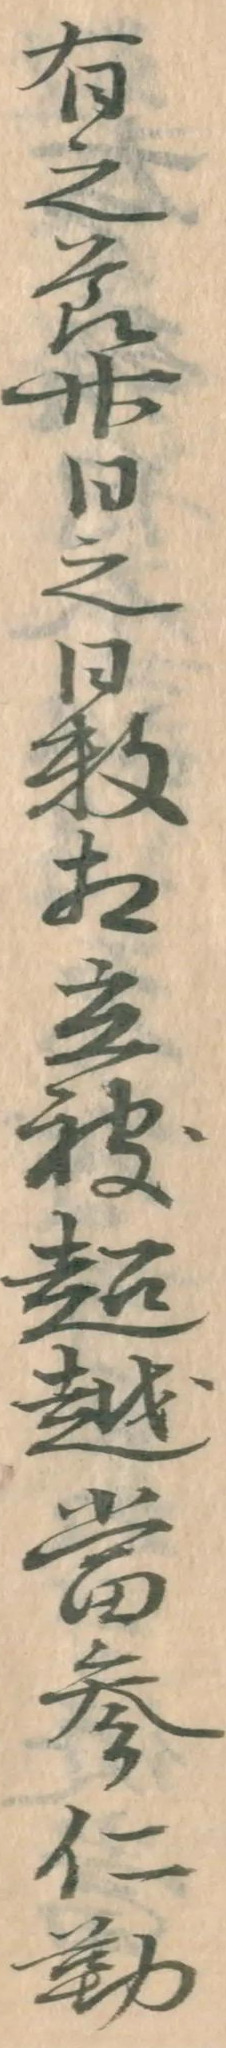有之節廿日之日数相立被超越當参仁勤
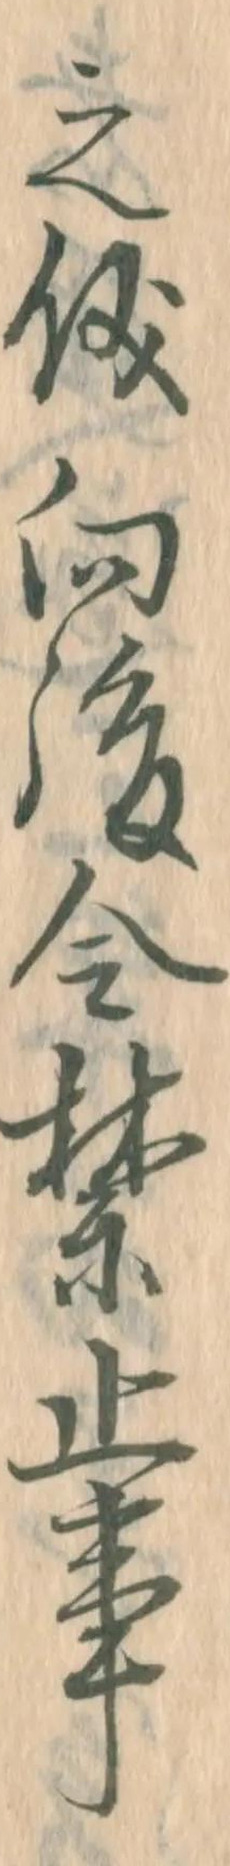之儀向後令禁止事
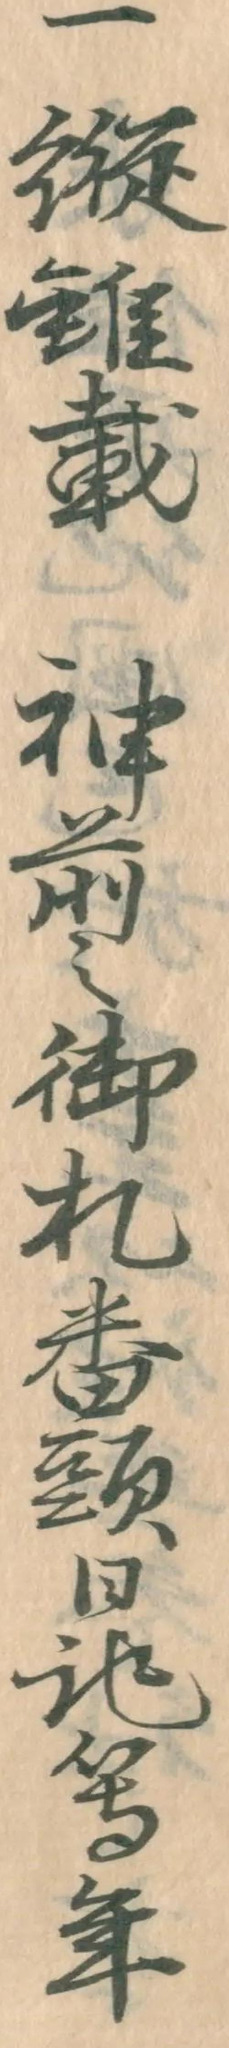一、縦雖載神前之御札番頭日記等年

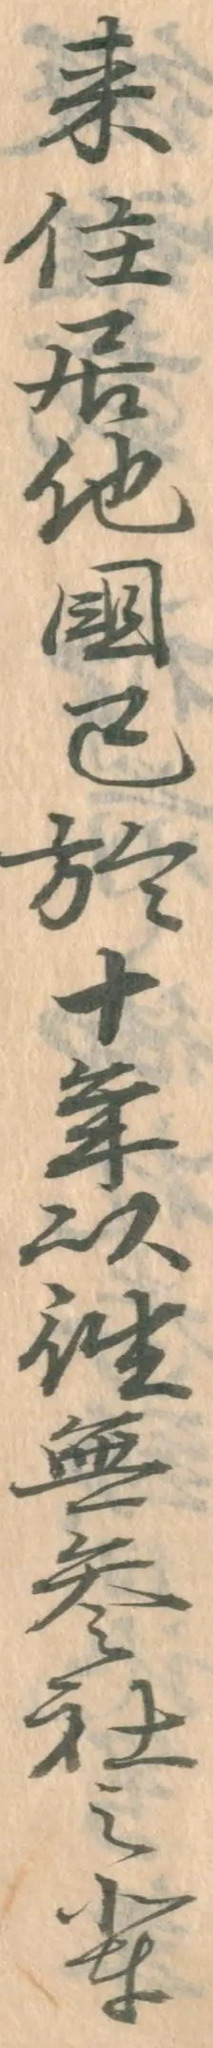来住居他國已於十年以往無参社之輩
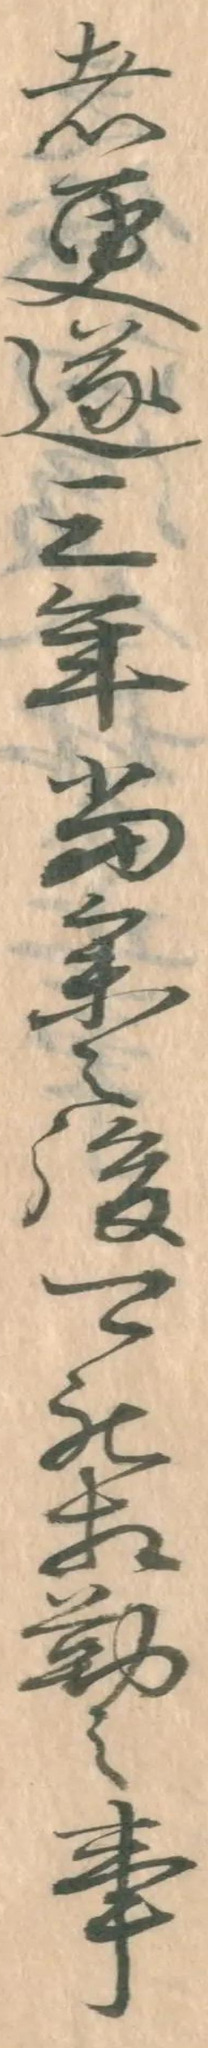者更遂三年當参之後可被相勤之事
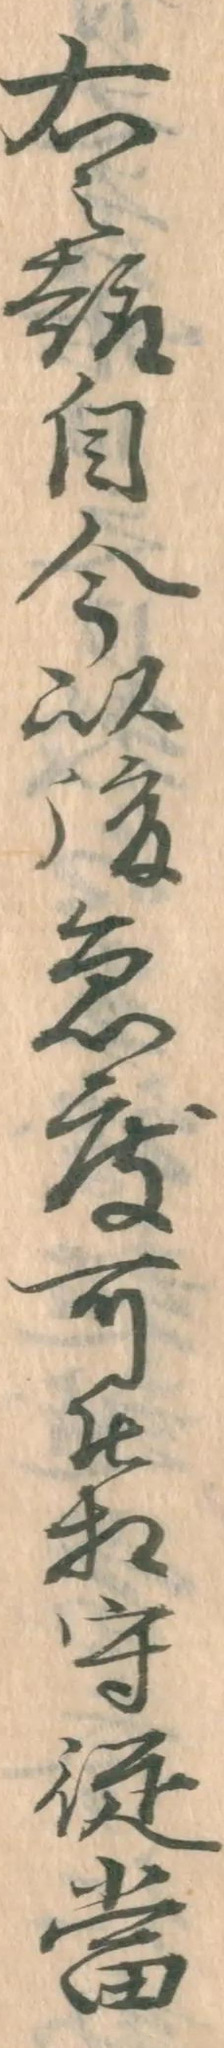右之趣自今以後急度可被相守従當
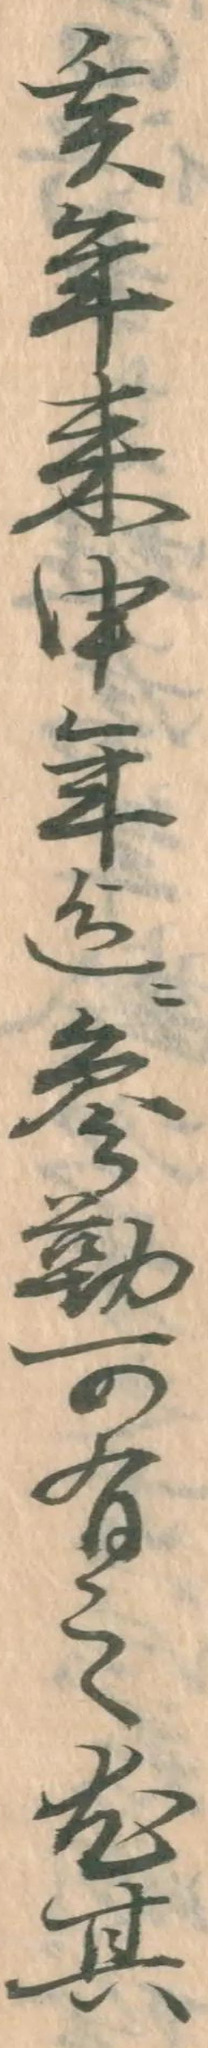亥年来申年迄ニ参勤可有之尤其
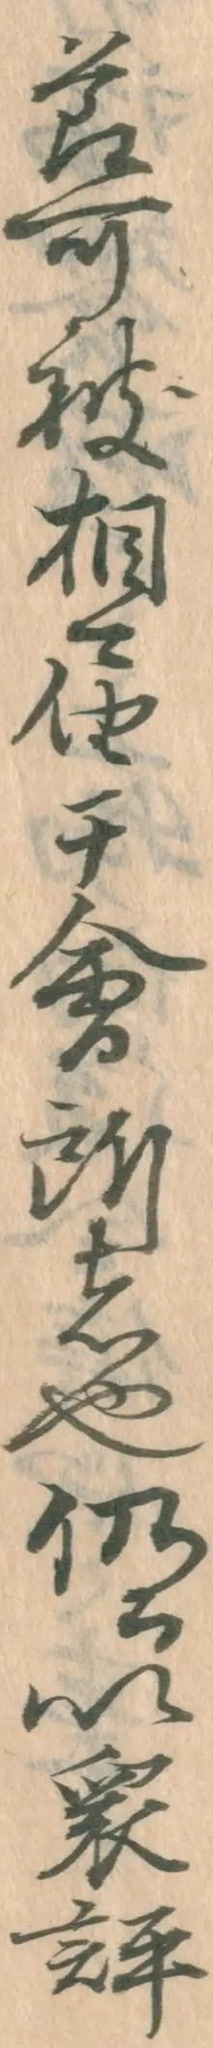節可被相届于會所者也仍而以衆評
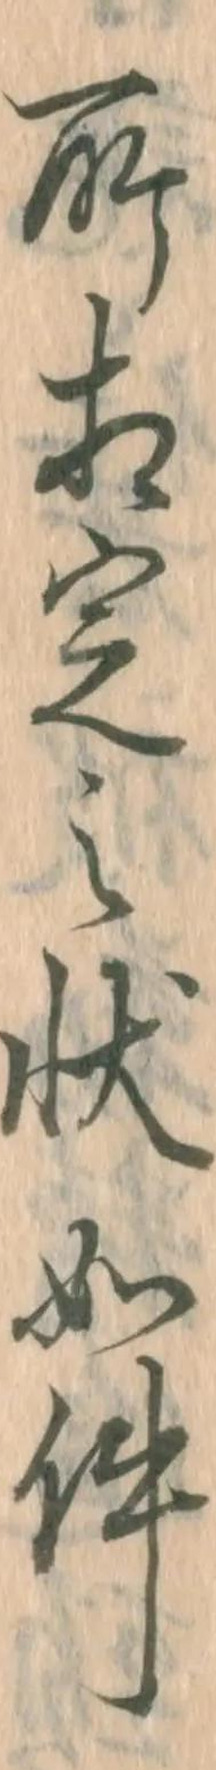所相定之状如件
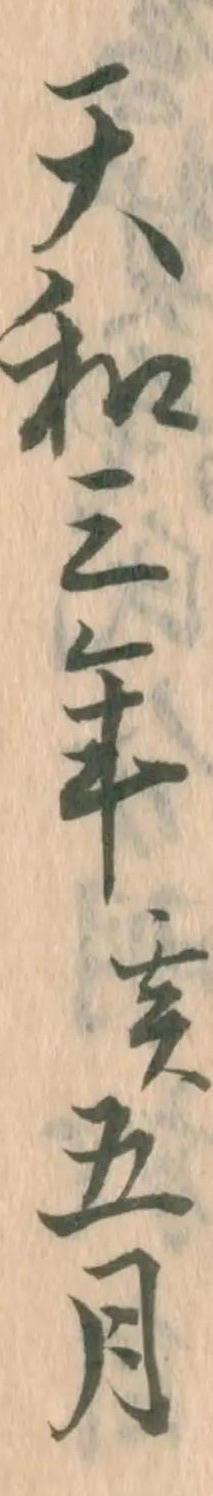天和三年亥五月
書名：賀茂社記録. 第39冊
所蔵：国立国会図書館 National Diet Library, JAPAN
